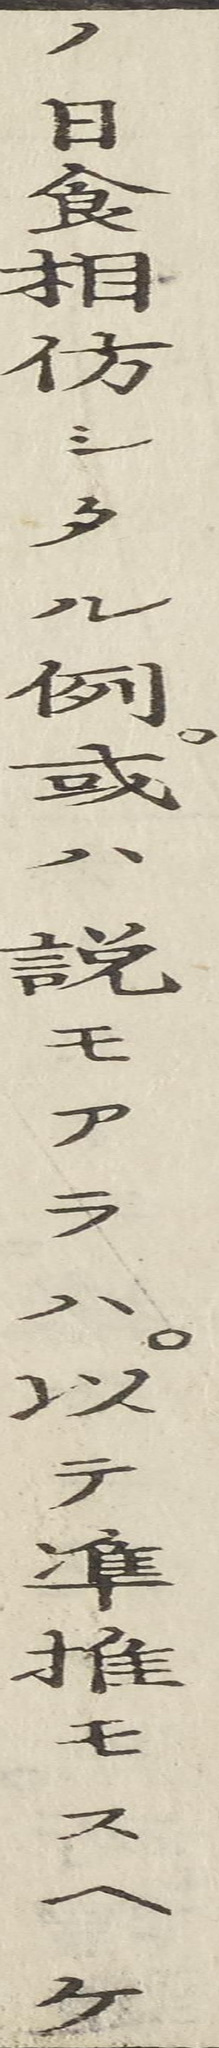ノ日食相仿シタル例。或ハ説モアラハ。以テ準推モスヘケ
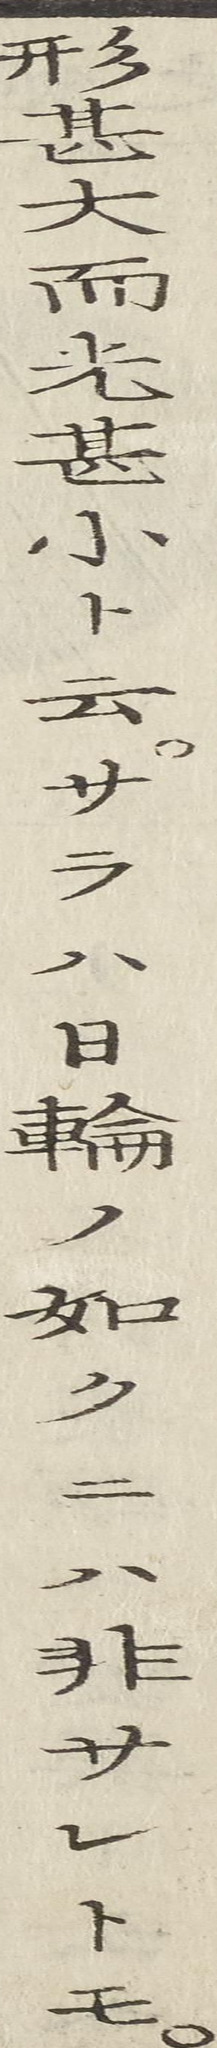形甚大而光甚小ト云。サラハ日輪ノ如クニハ非サレトモ。
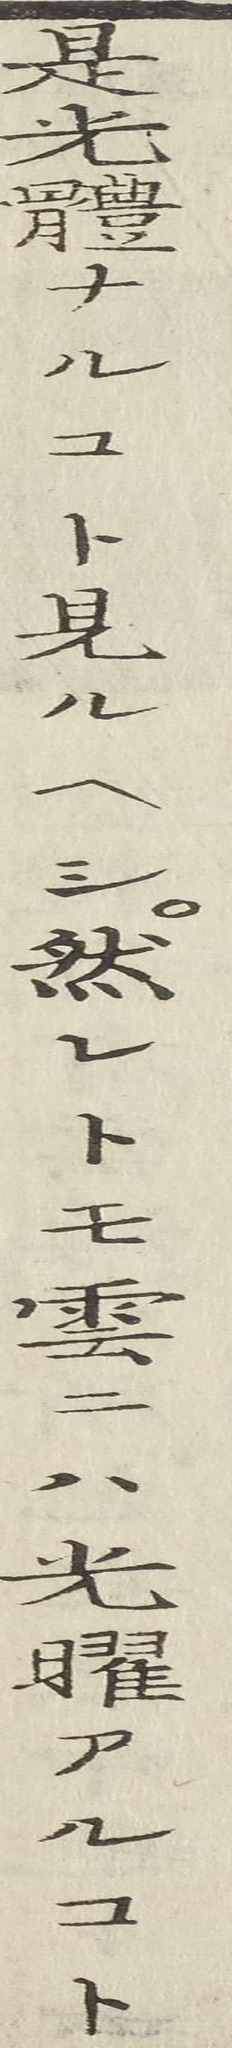是光体ナルコト見ルヘシ。然レトモ雲ニハ光曜アルコト
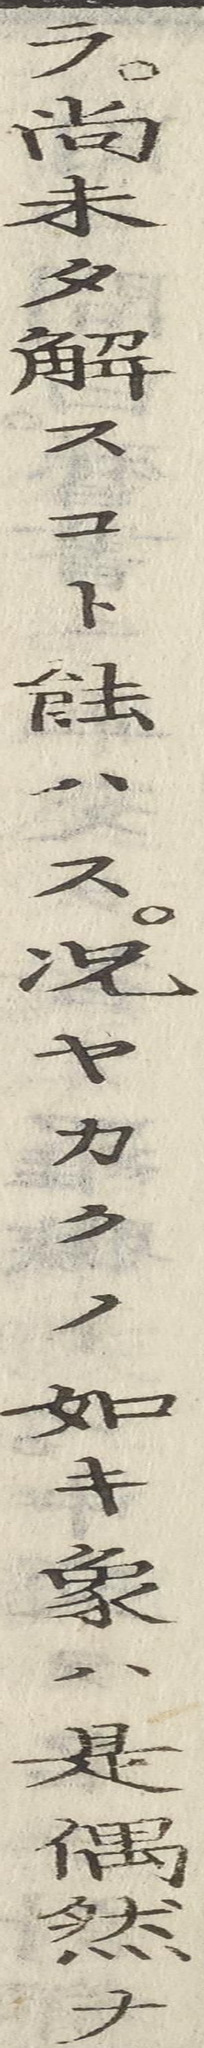ラ。尚未タ解スコト能ハス。況ヤカクノ如キ象ハ是偶然ナ
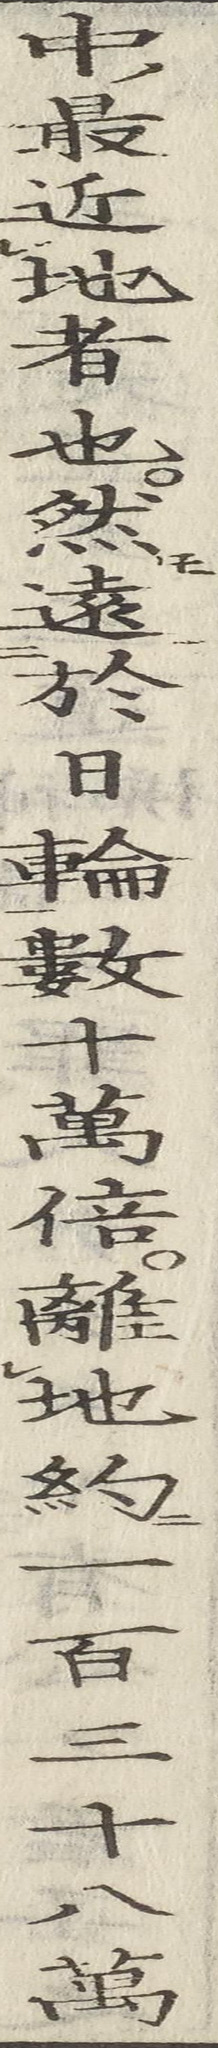中最近地者也。然遠ニ於日輪数十万倍。離地約一百三十八万
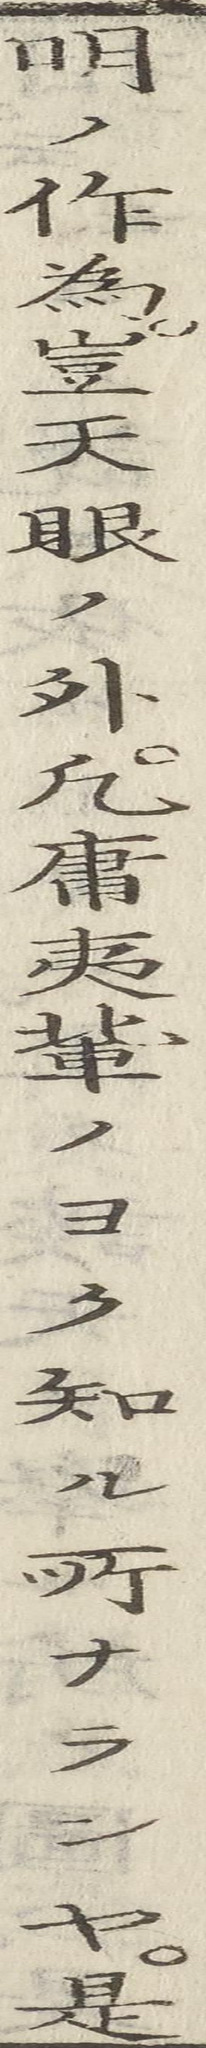明ノ作為。豈天眼ノ外。凡庸夷輩ノヨク知ル所ナランヤ。是
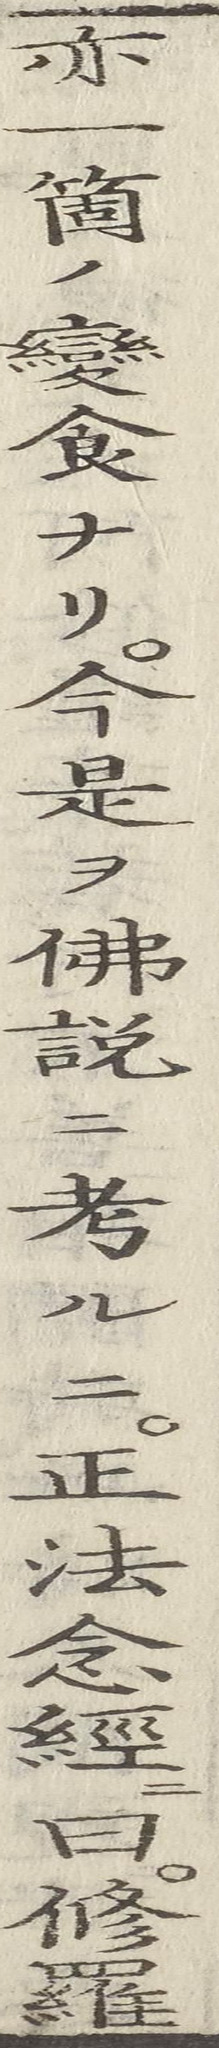亦一箇ノ変食ナリ。今是ヲ仏説ニ考ルニ。正法念経曰。修羅
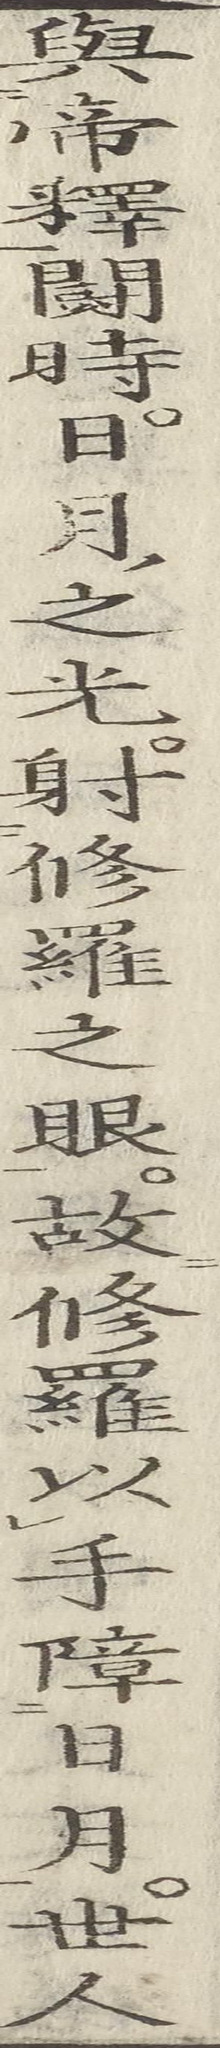与ニ帝釈闘時。日月之光。射ニ修羅之眼。故修羅以手障ニ日月。世人

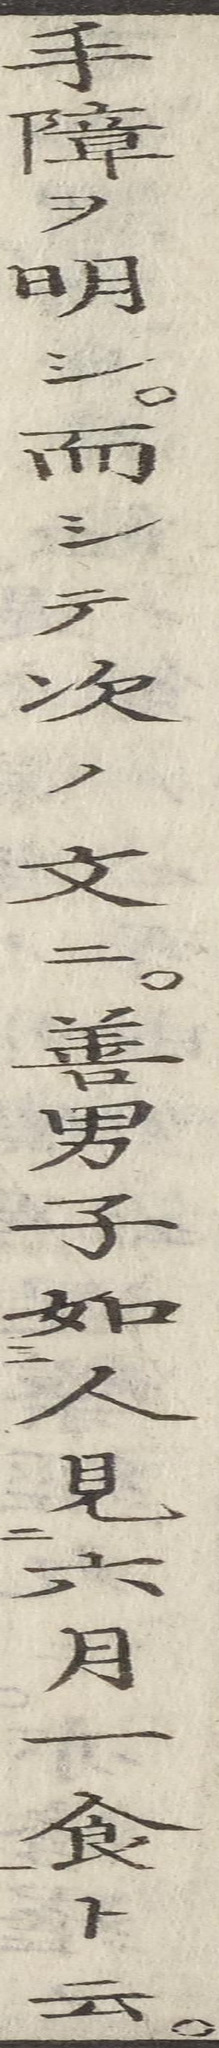手障ヲ明シ。而シテ次ノ文ニ。善男子如人見ニ六月一食ト云。
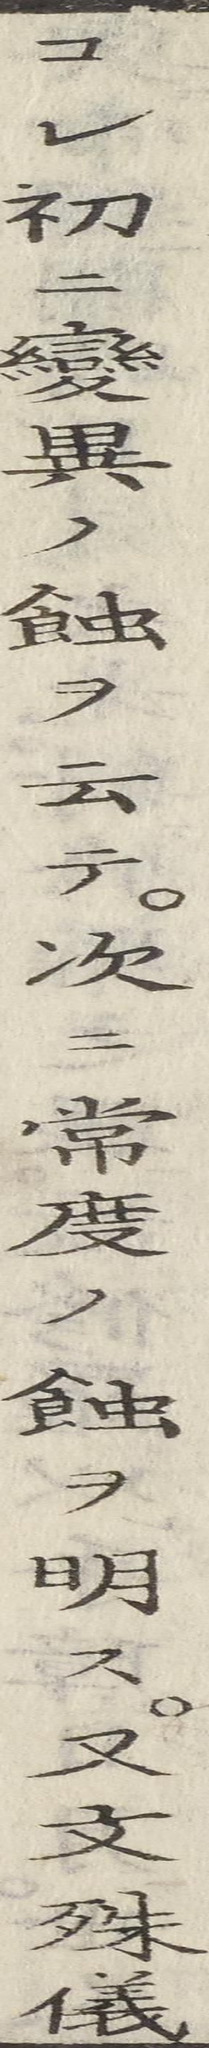コレ初ニ変異ノ蝕ヲ云テ。次ニ常度ノ蝕ヲ明ス。又文殊儀
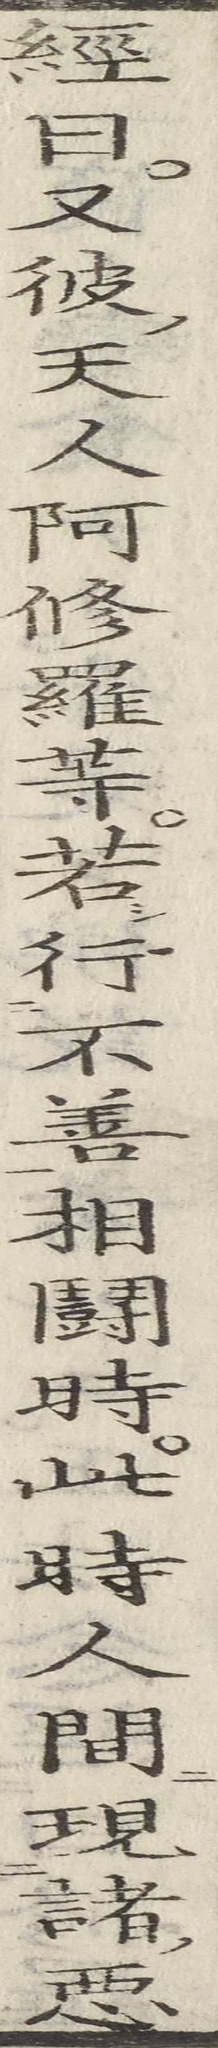経曰。又彼天人阿修羅等。若行ニ不善相闘時。此時人間現ニ諸悪
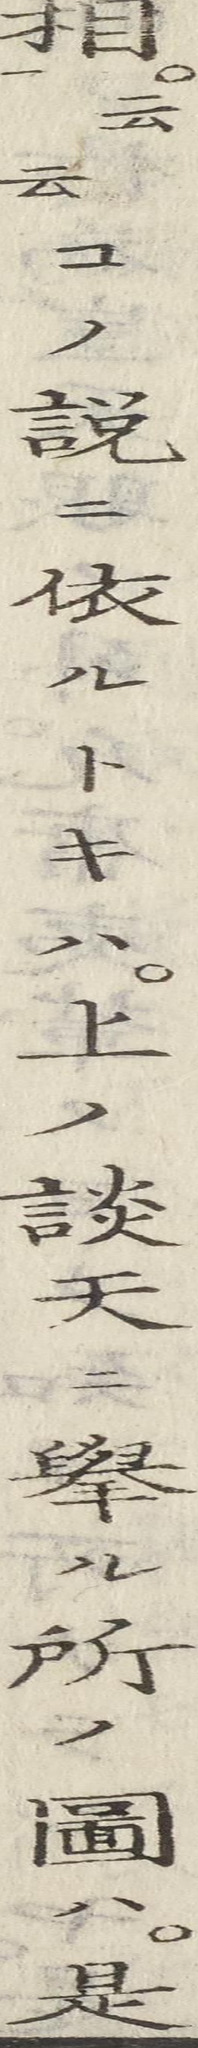相。云云コノ説ニ依ルトキハ。上ノ談天ニ挙ル所ノ図ハ。是
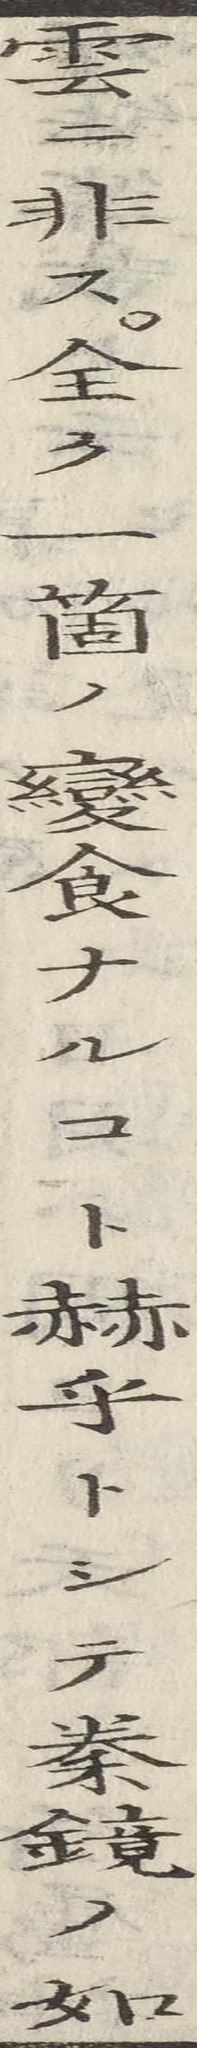雲ニ非ス。全ク一箇ノ変食ナルコト赫乎トシテ䅈鏡ノ如
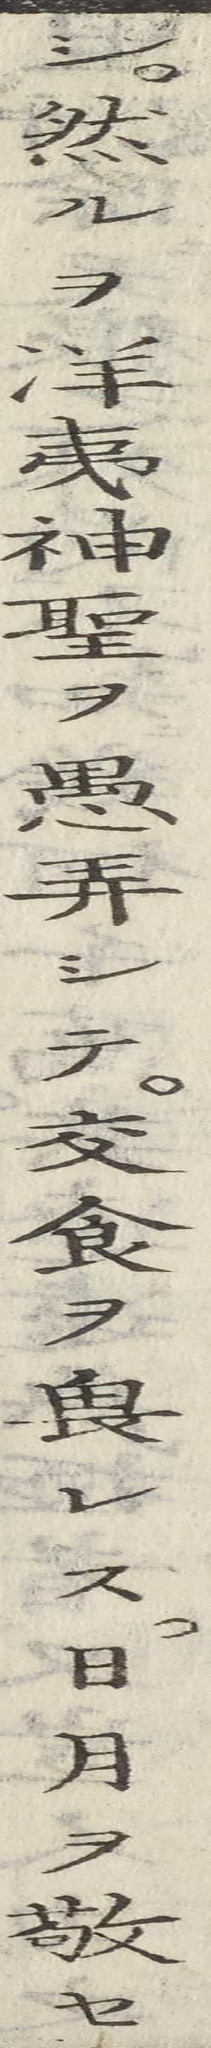シ。然ルヲ洋夷神聖ヲ愚弄シテ。交食ヲ畏レス。日月ヲ敬セ
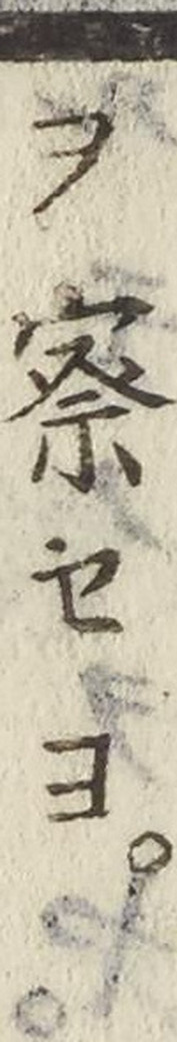ヲ察セヨ。
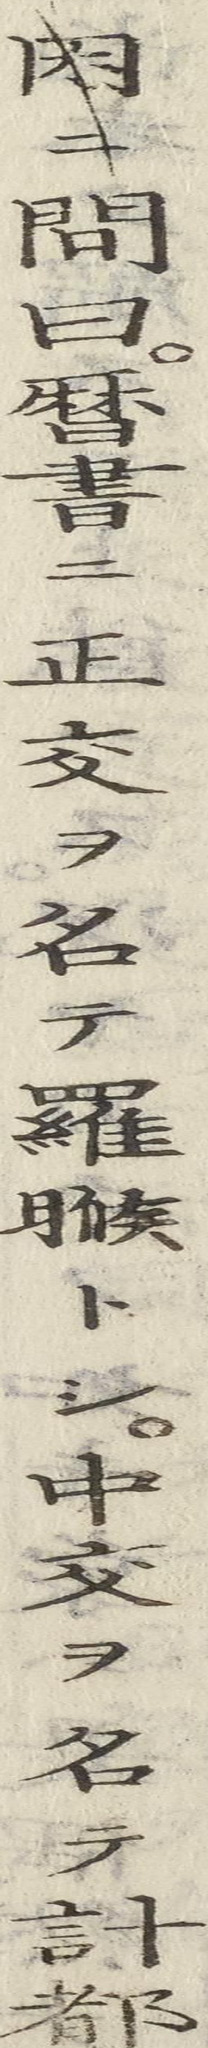因ニ問曰。暦書ニ正交ヲ名テ羅睺トシ。中交ヲ名テ計都
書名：護法新論　二編　下
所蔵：東京大学地震研究所図書室 Earthquake Research Institute Library, The University of Tokyo, JAPAN
